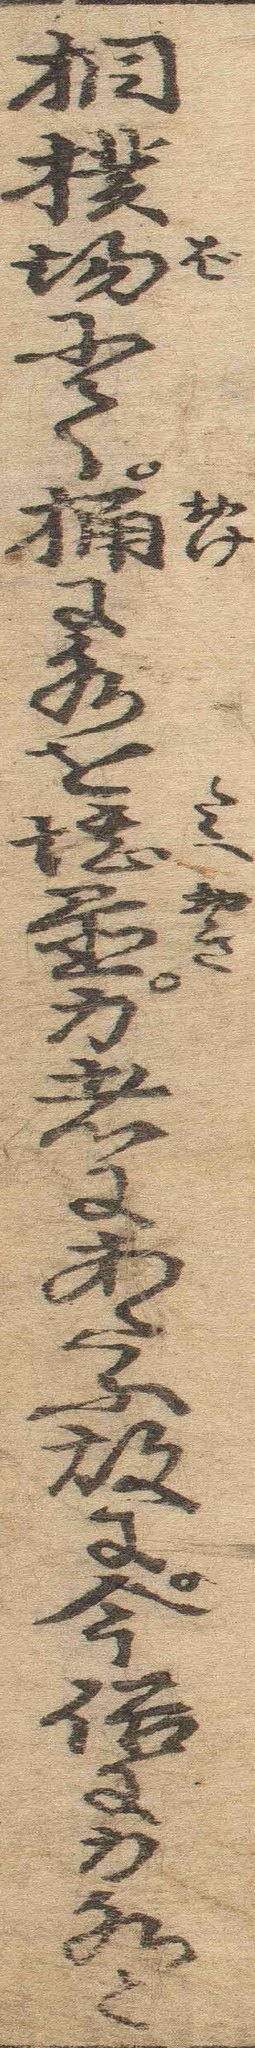相撲場にて。桶に水を堪置。力者にあたふ故に。今俗に力水と

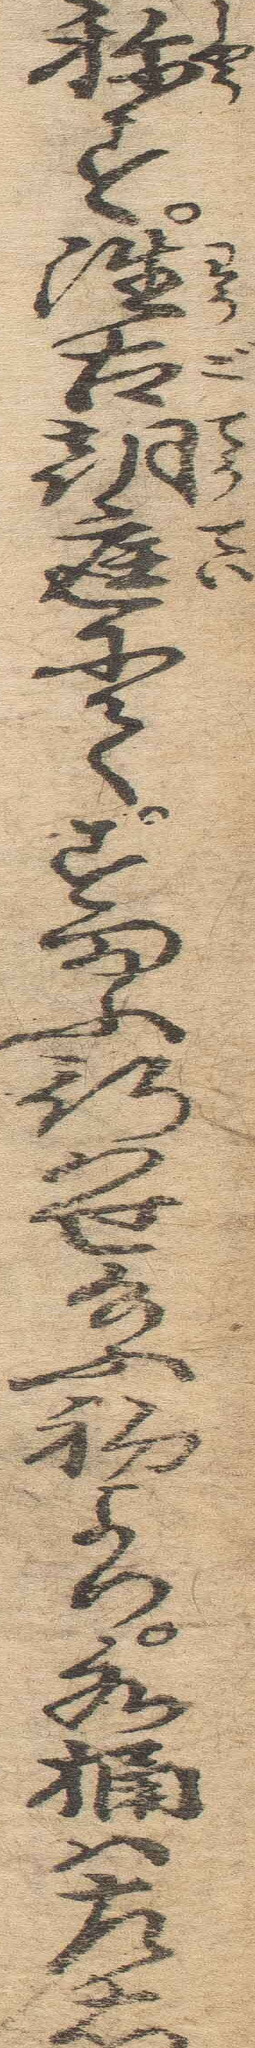称す。往古朝庭にて。すまふ行はせ給ふ初より。水桶は左右
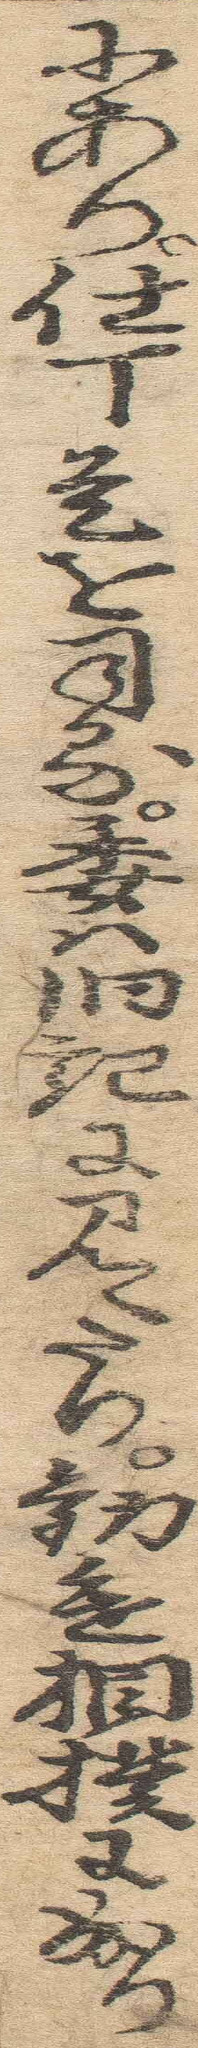にあり。仕丁是を司る。委は旧記に見えたり。勧進相撲に成り
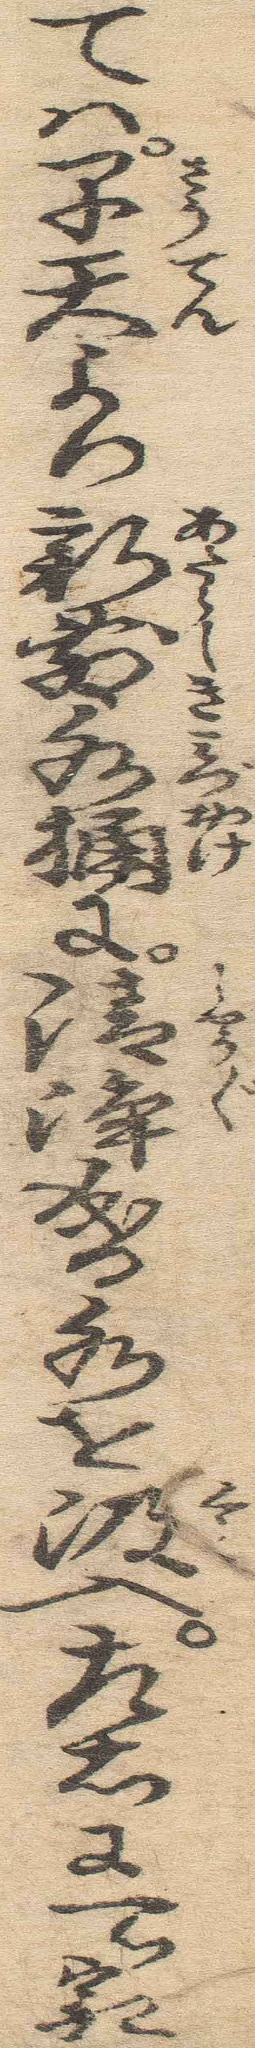ては。早天より新敷水桶に。清浄成る水を汲入。左右に一つ宛
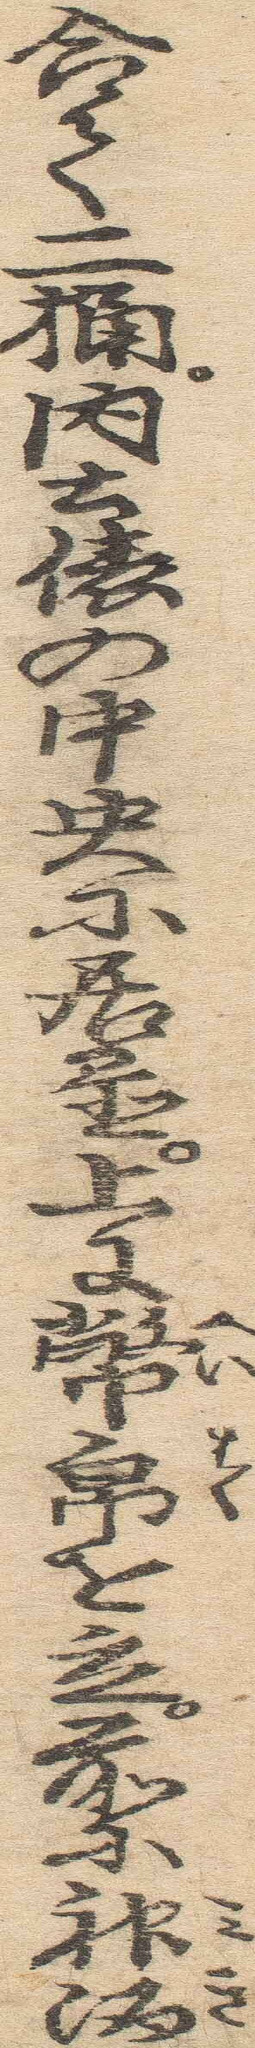合て二桶。内土俵の中央に居置。上に幣帛を立。前に神酒
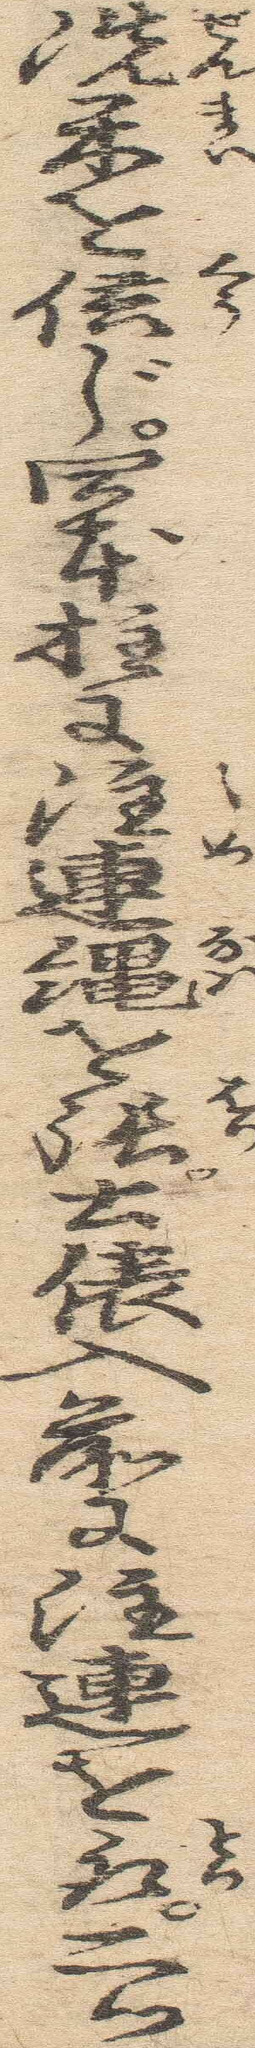洗米を供じ。四本柱に注連縄を張。土俵入前に注連を取。二つ
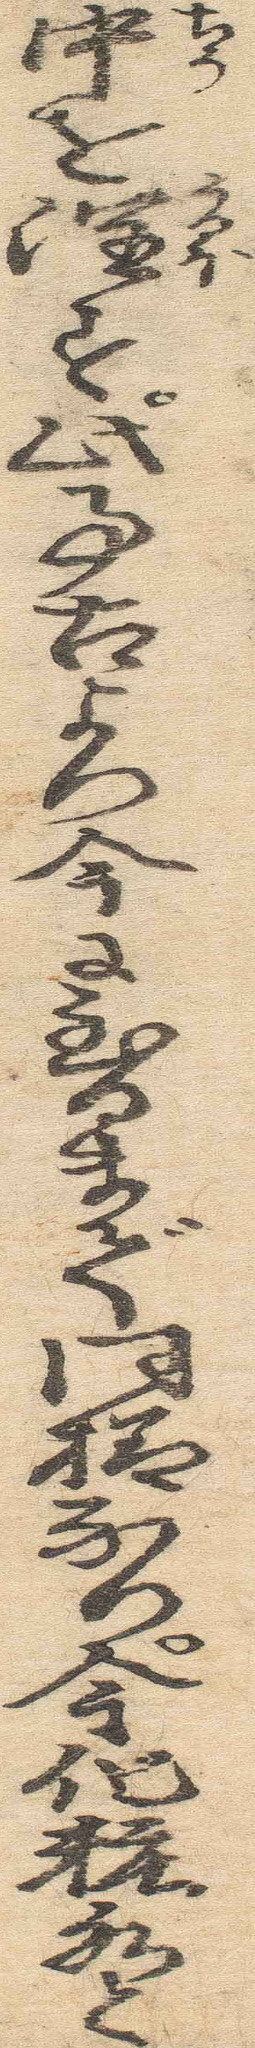中を潤す。此事古より今に至るまで同様なり。今化粧水と
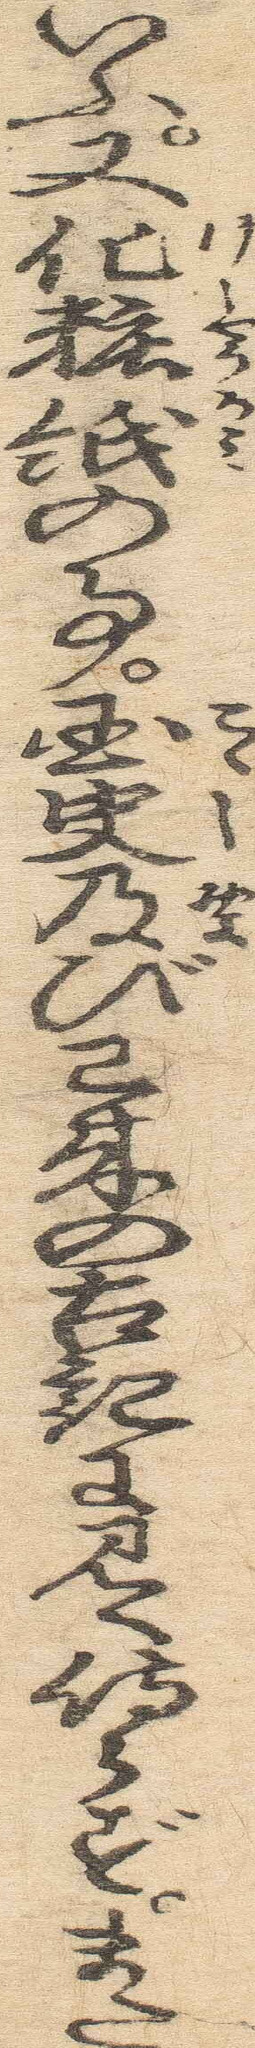いふ。又化粧紙の事。国史及び已来の古記に見え侍らず。また
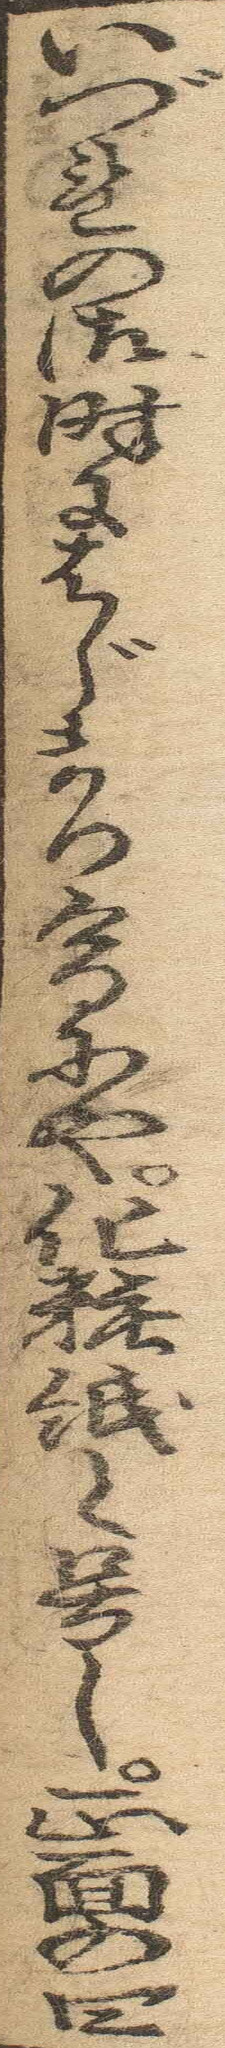いづれの御時にはじまりけるにや。化粧紙と号し。正面の四
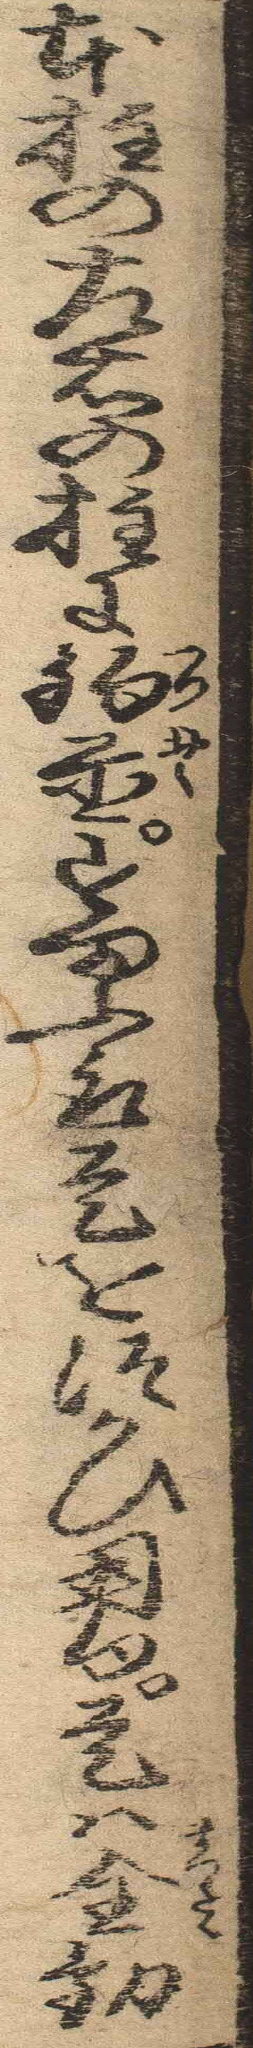本柱の左右の柱に釣置。すまふ取是をつかひ用ゆ。是は全勧
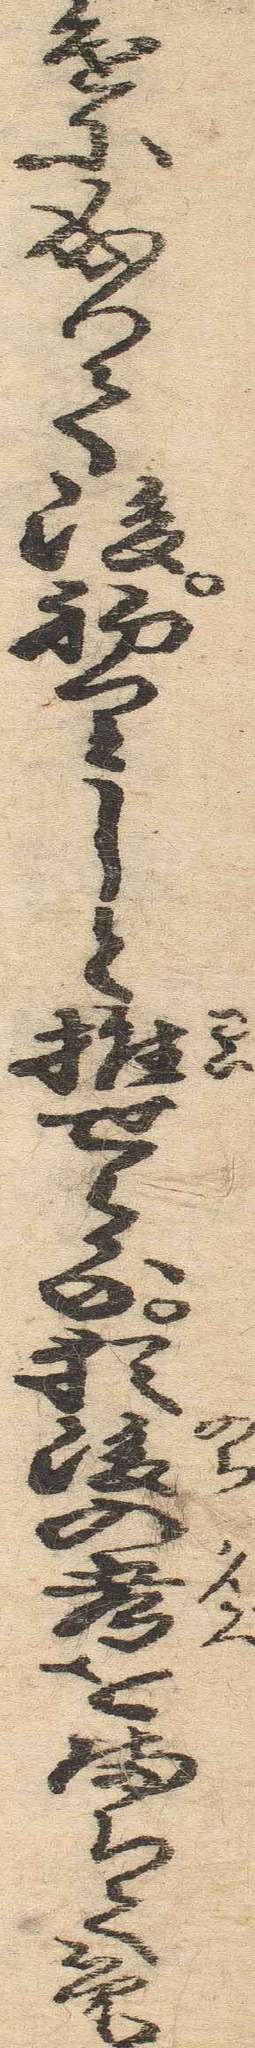進に成りて後。初りしと推せらる。猶後の考をまつて筆
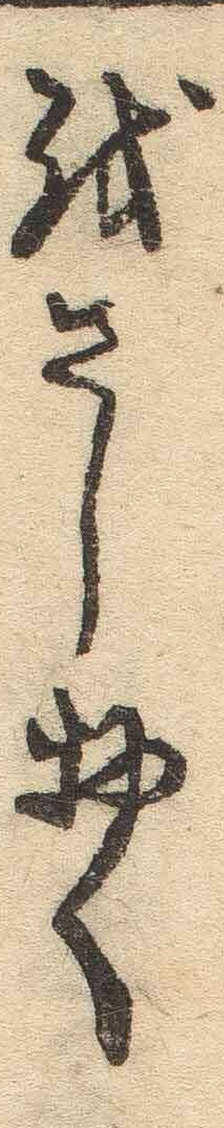をさしおく
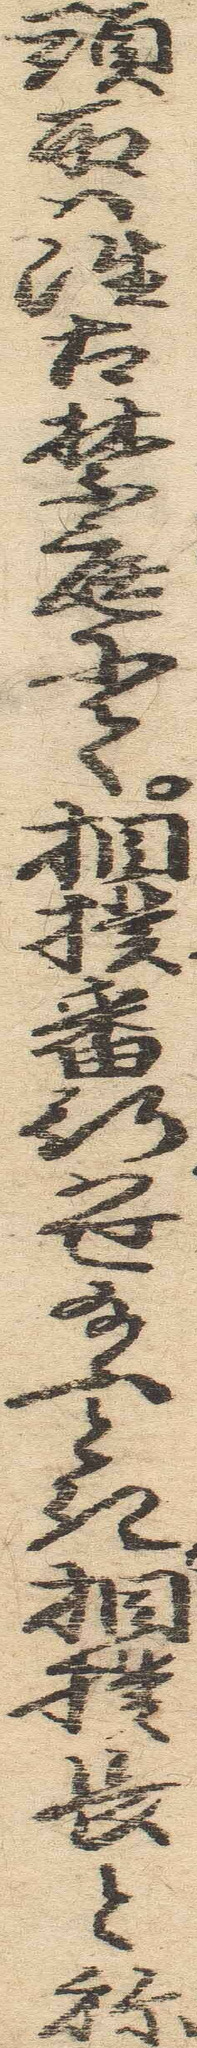頭取は往古禁庭にて。相撲番行はせ給ふとき。相撲長と称
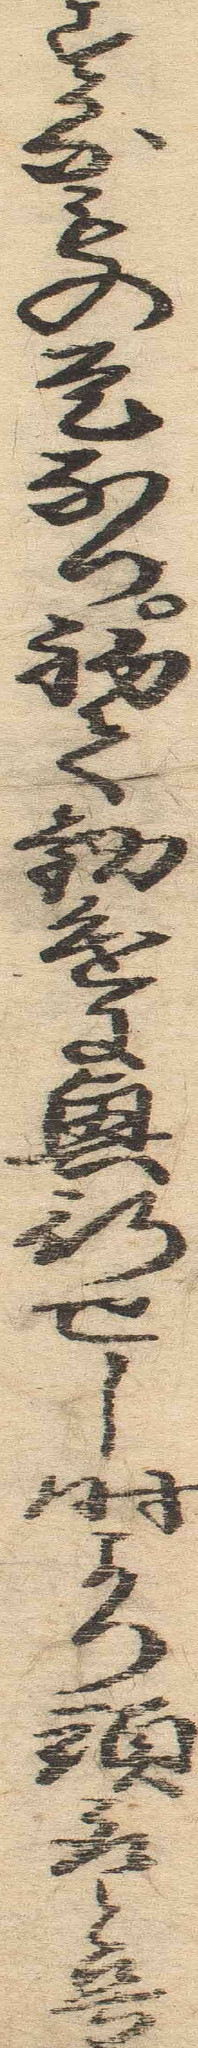するもの是なり。初て勧進に興行せし時より頭取と号
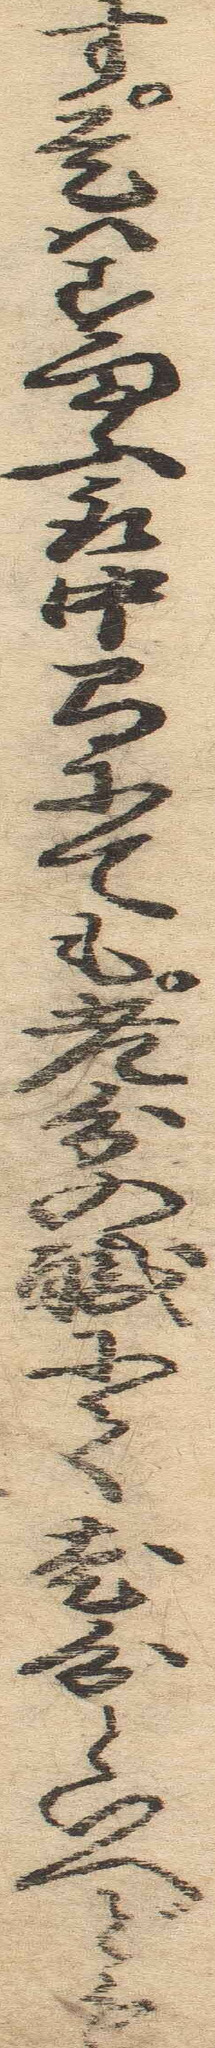す。是はすまふ取中間にても。老分の職にて老分といへども。
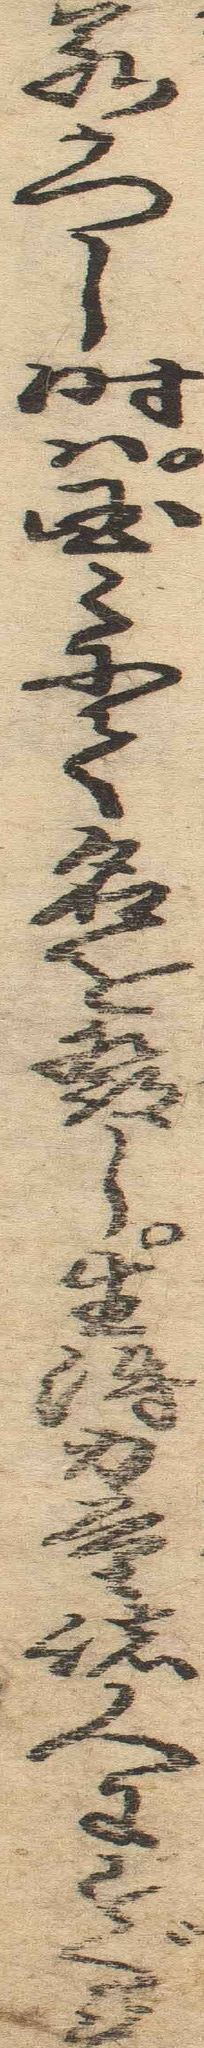若かつし時は。国々にて名を発し。生得力量諸人に
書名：古今相撲大全
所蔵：東京学芸大学附属図書館 国文学研究資料館
